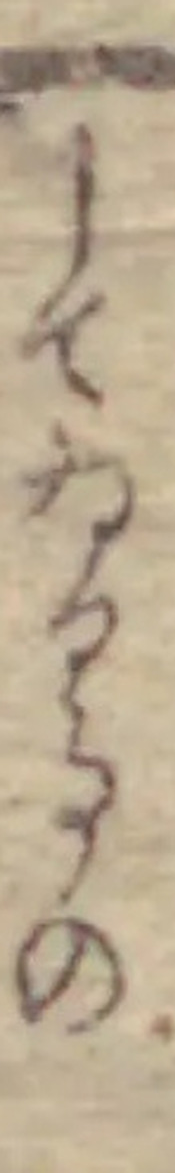してゐる事の
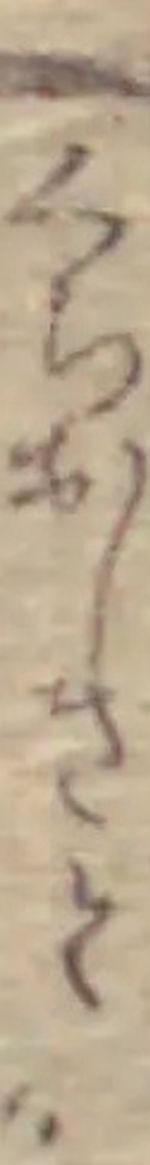くちおしきと
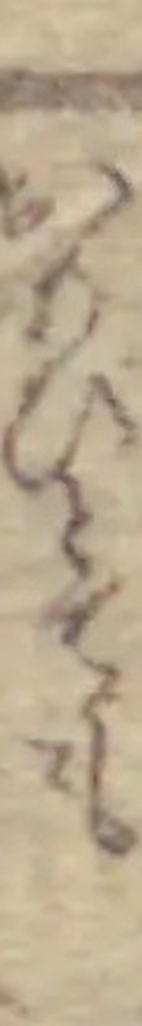おもひとても
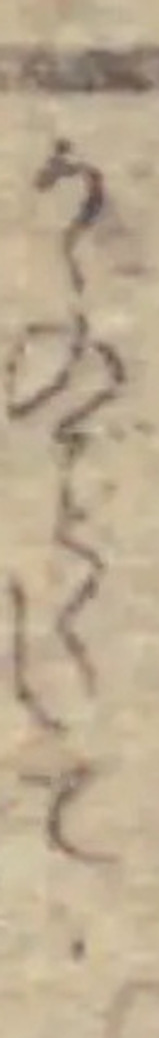かくのごとくして
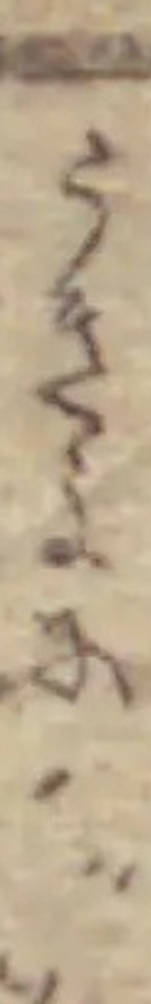うきよに
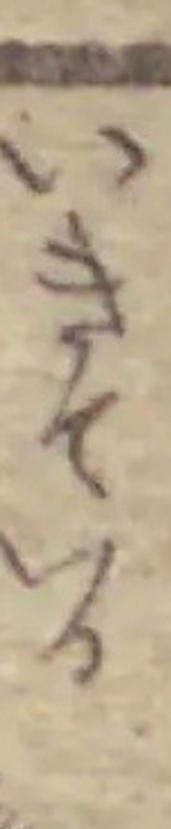いきている
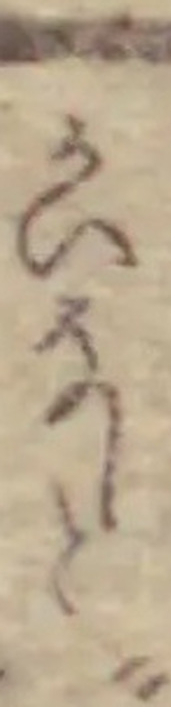かいなしと
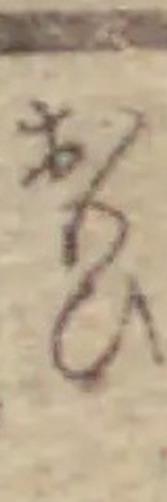おもひ
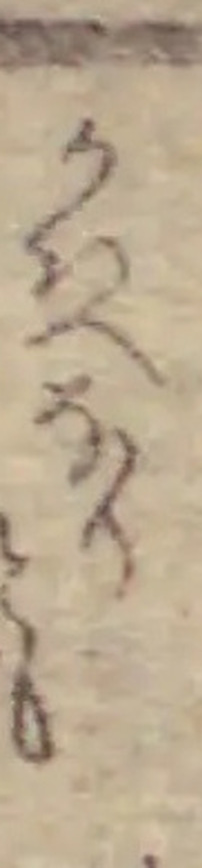かはへなりとも
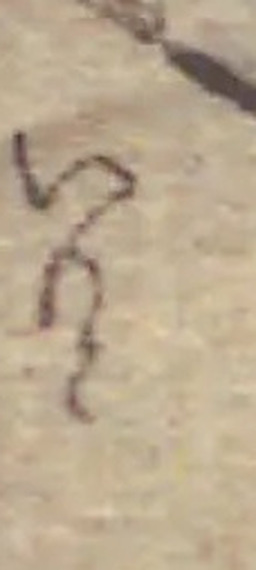いもと
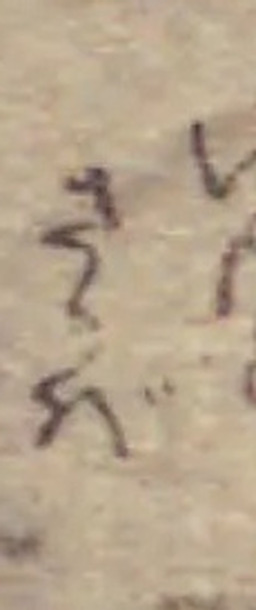さらば
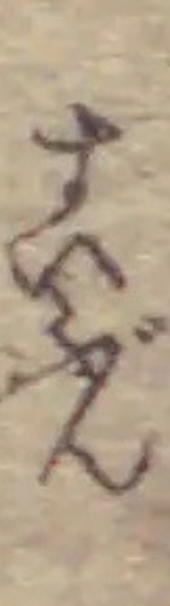すいぶん
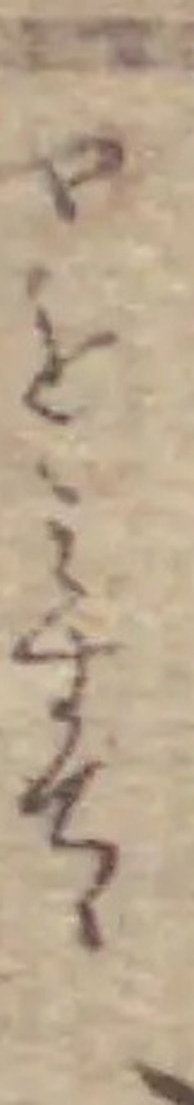やをみすてゝ
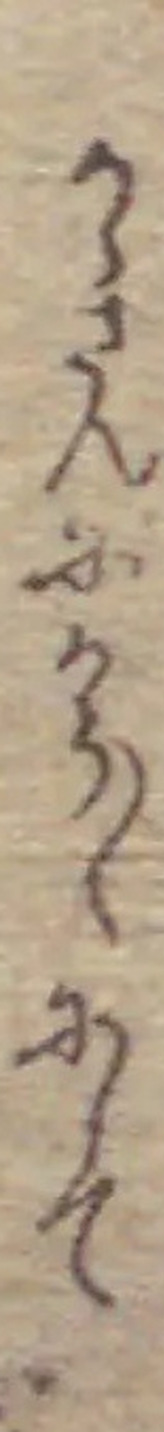かゝさんにかう〳〵にして
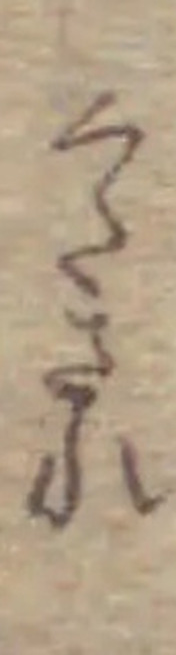くたされ

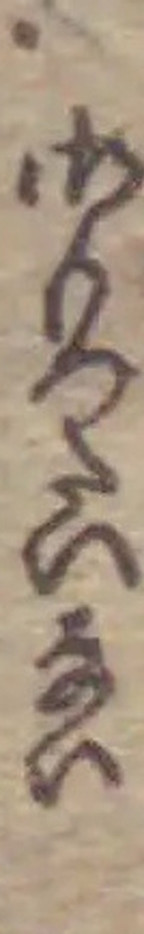御もつたいない
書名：奥州咄 3巻
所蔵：国立国会図書館 National Diet Library, JAPAN
